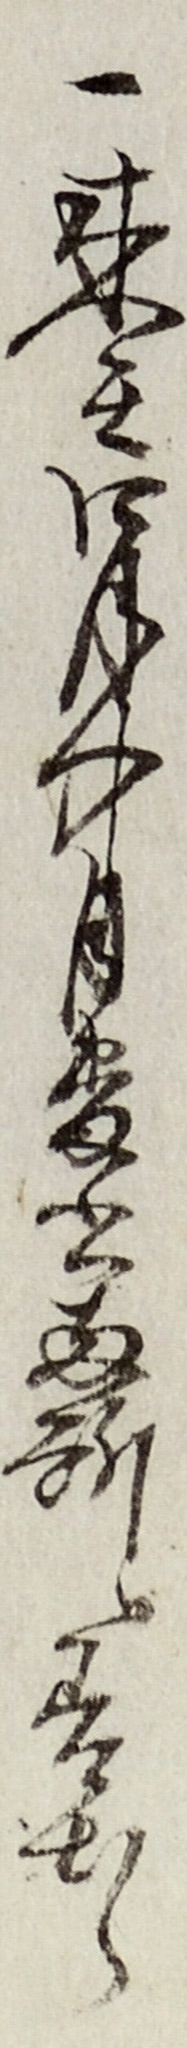一来閏四月中月番書両所江差出候
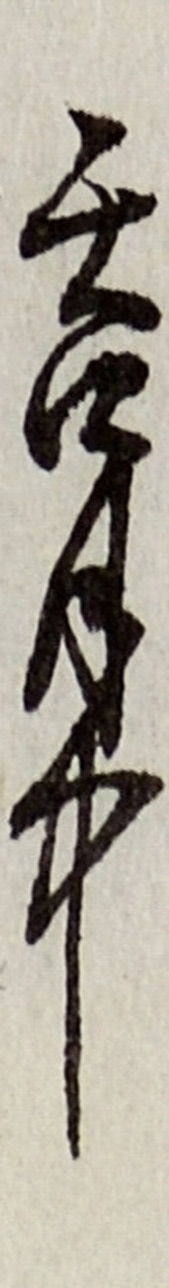閏四月中
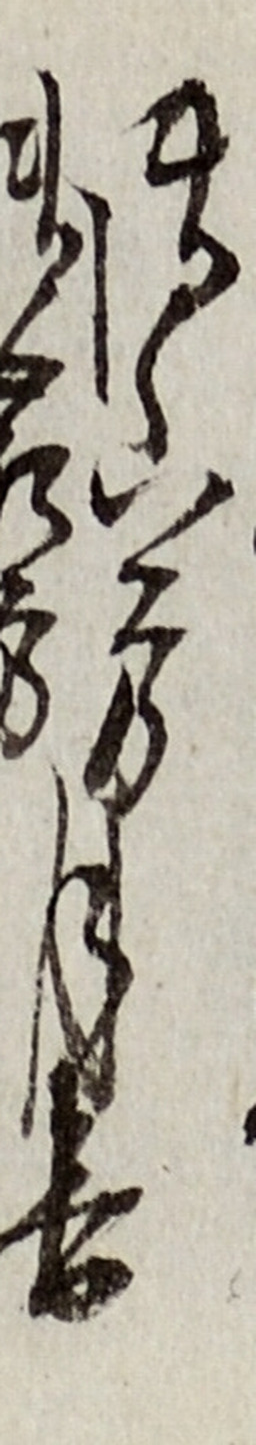廿六日
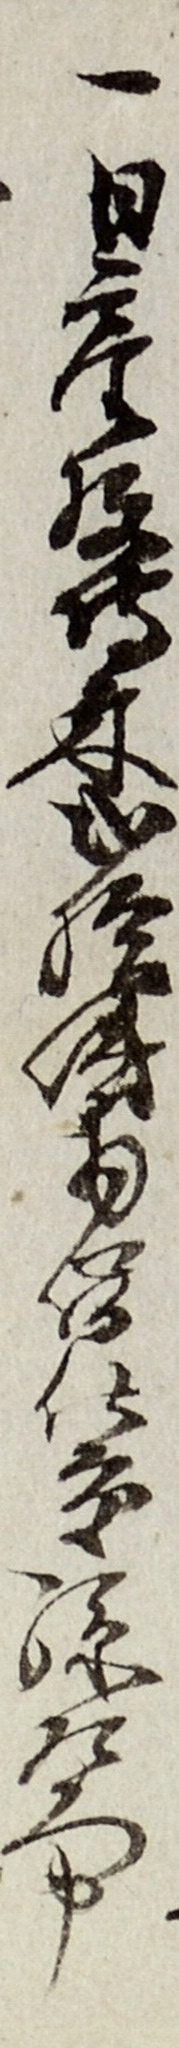一日雇扶持米弐拾俵拝借仕度孫左衛門申
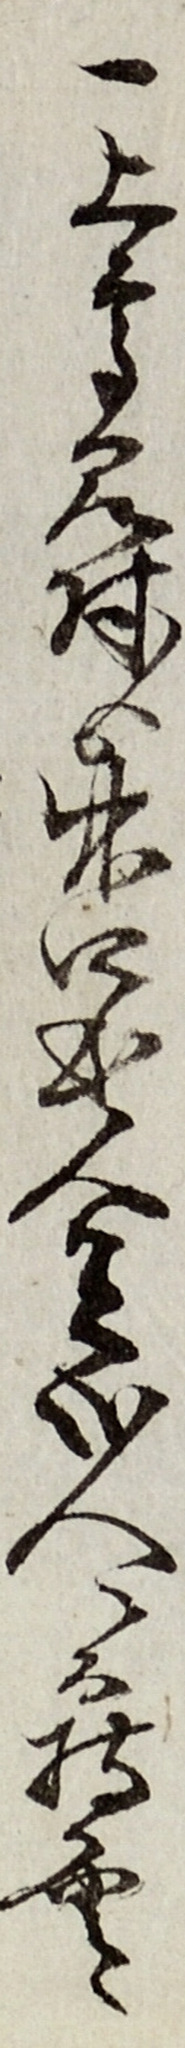一上高見村ゟ木四本人足弐人ニ而持届候
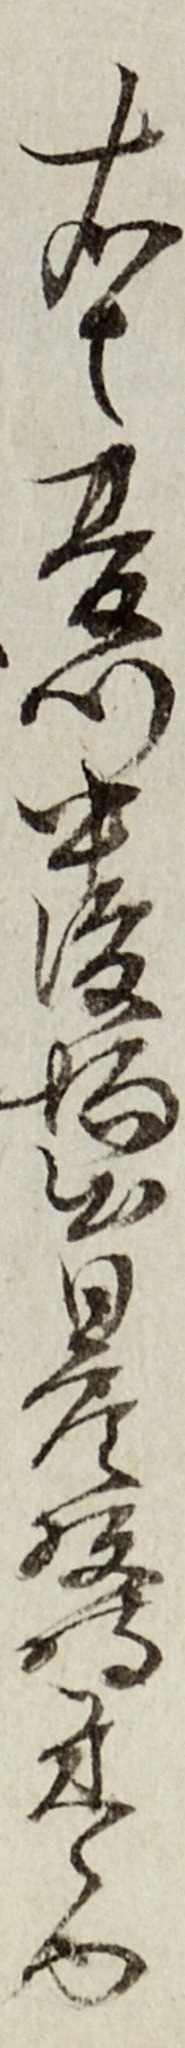右者夏川中渡場出日雇扶持米之内
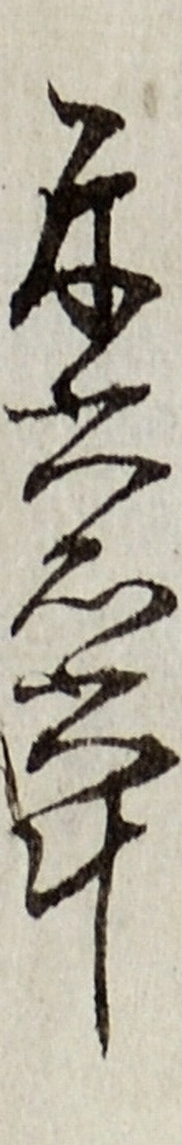米六石六斗
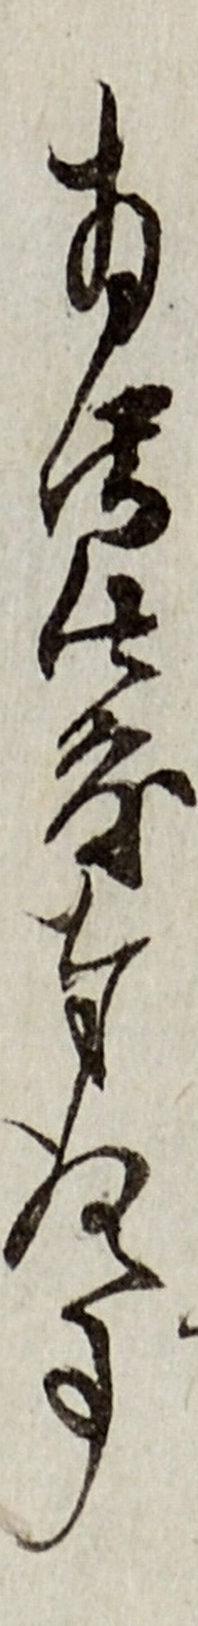拝借仕度奉存候事
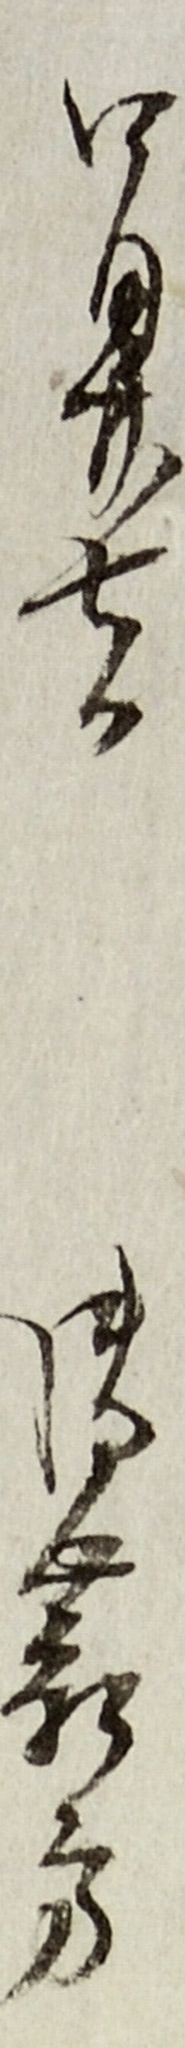四月廿七日御薪方
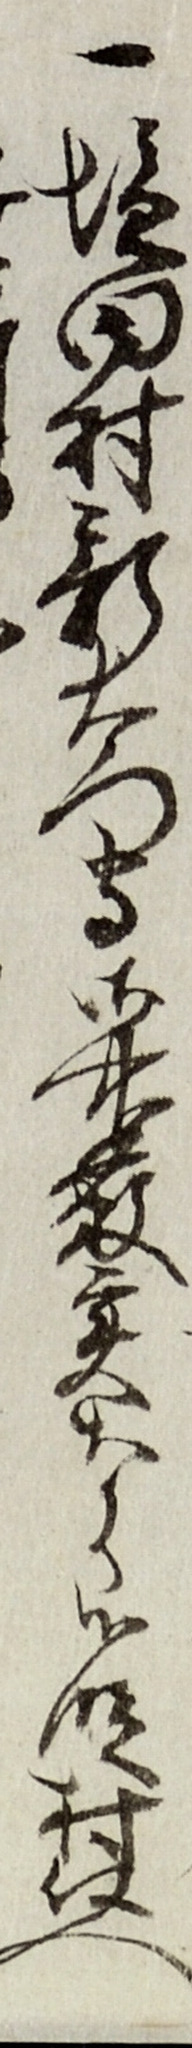一塩田村新右衛門守御竹薮実なり候段村役人
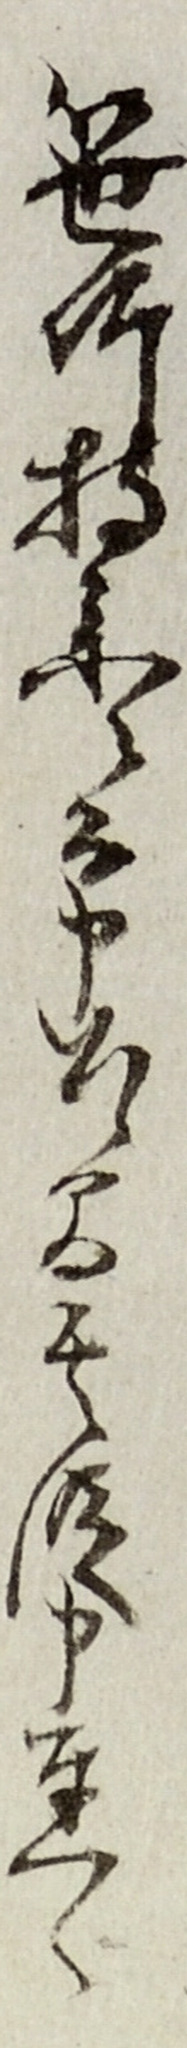笹竹持参ニ而申出候間其段申達候
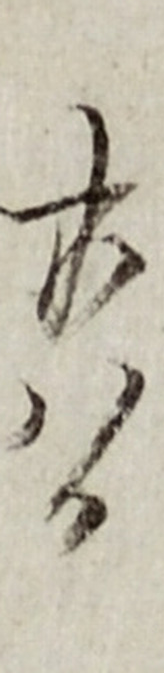廿八日
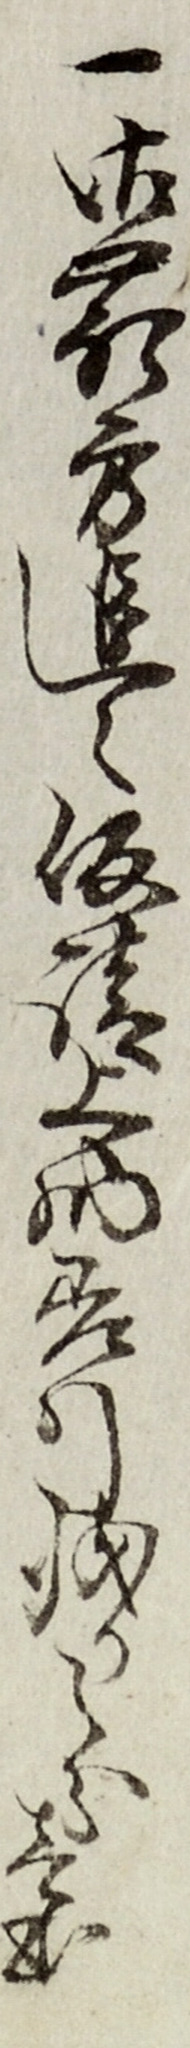一御薪方追々仮請上納差引残り之分壱本
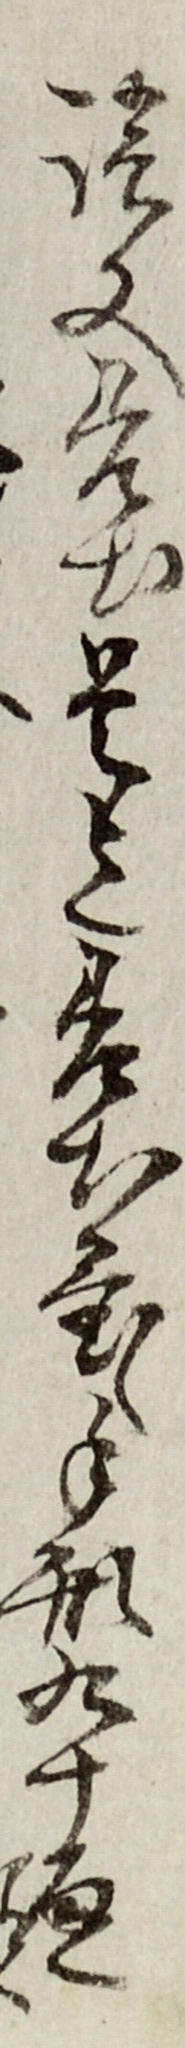証文差出是迄差出置候手形九十通
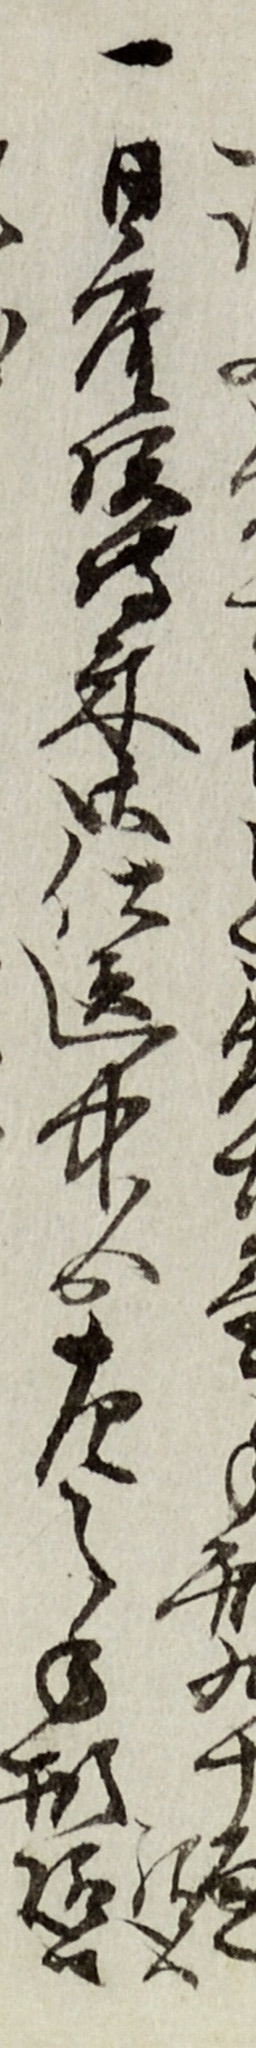一日雇扶持米御仕送中ゟ左之手形請取
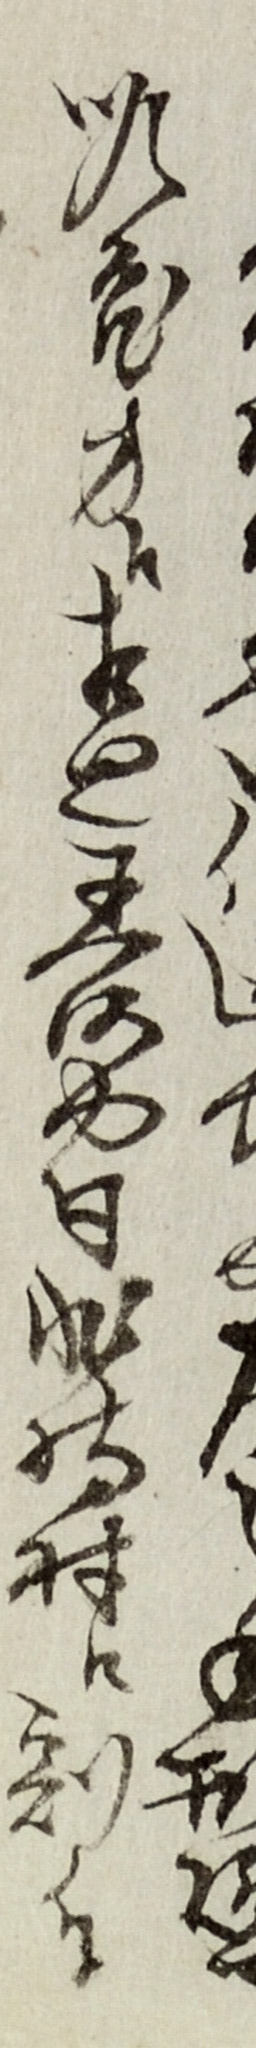順蔵方江相廻黒河内村非持村江割付
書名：御山方御薪方諸事御用留
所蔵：伊那市立高遠町図書館・合同会社AMANE
